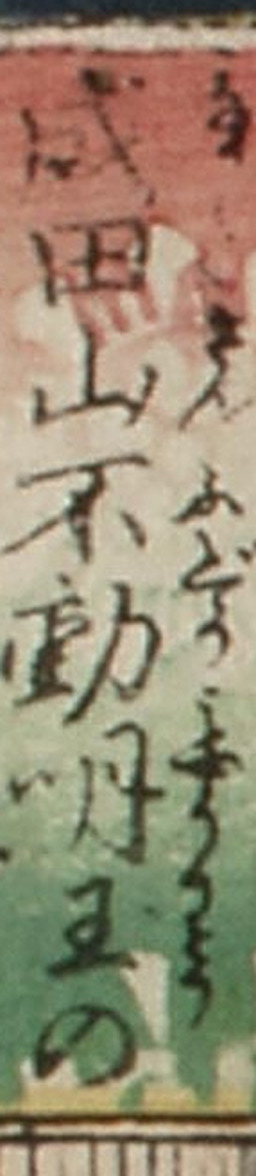成田山不動明王の
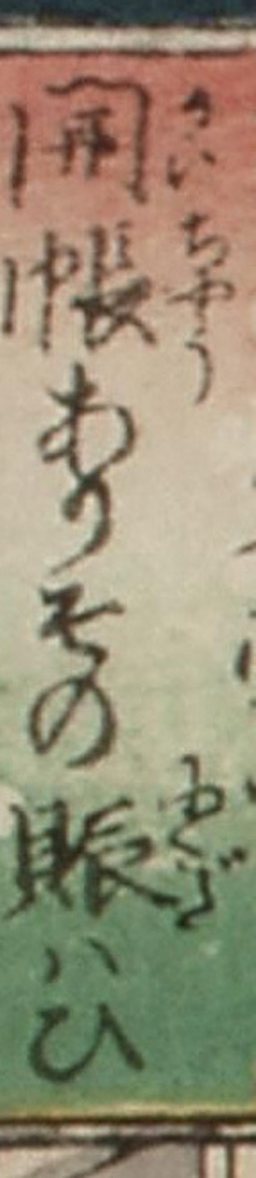開帳ありその賑はひ

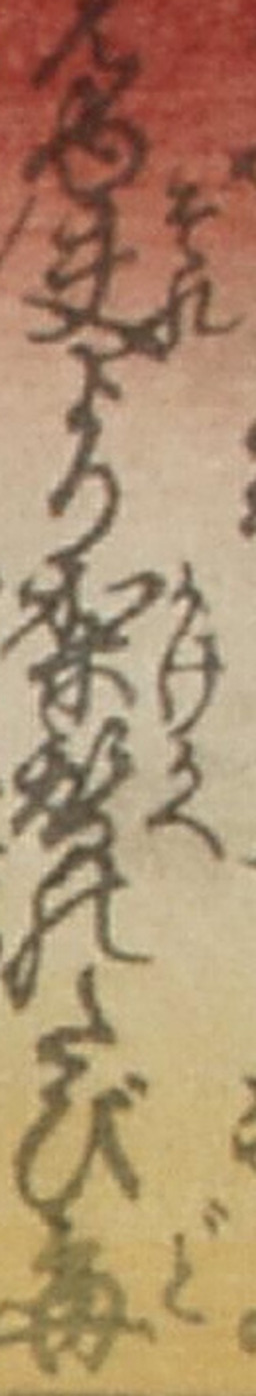見ゆ夫より架替のたび毎
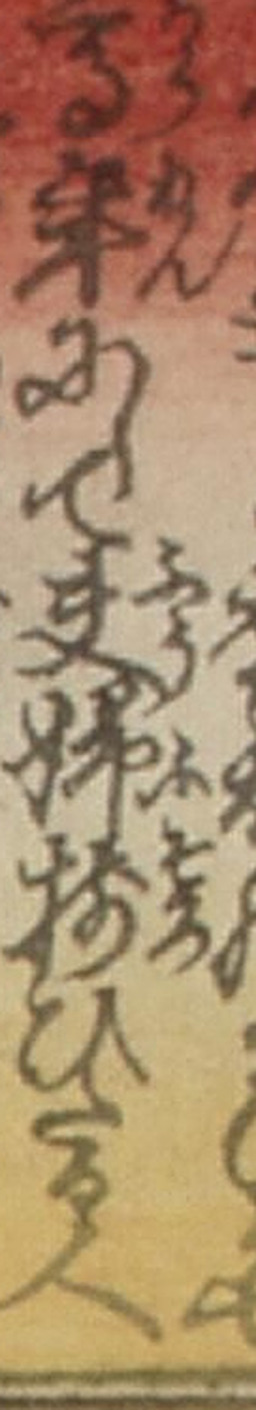高年にして夫婦揃ひたる人
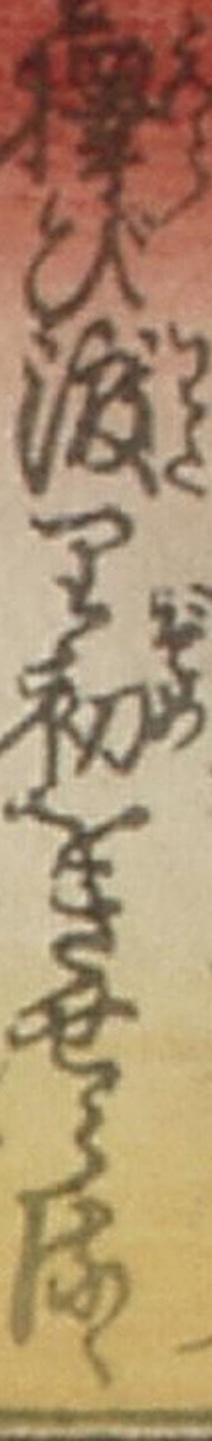を擇び渡り初をさせらるゝ
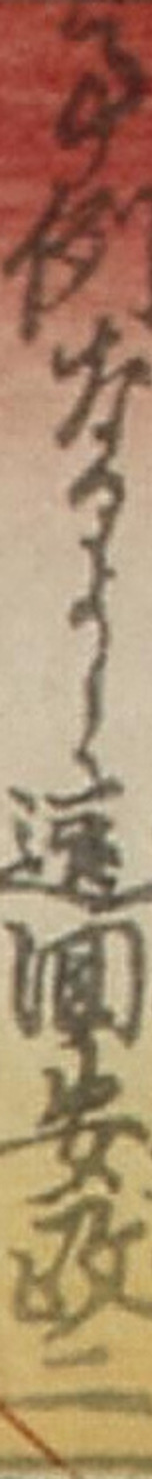事例なるよし這回安政二
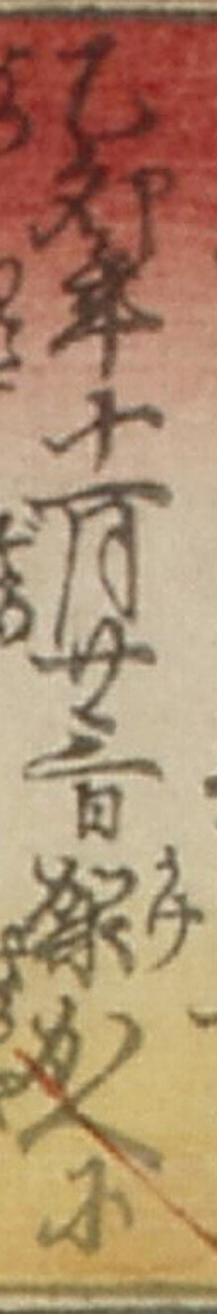乙卯年十一月廿三日架かへに
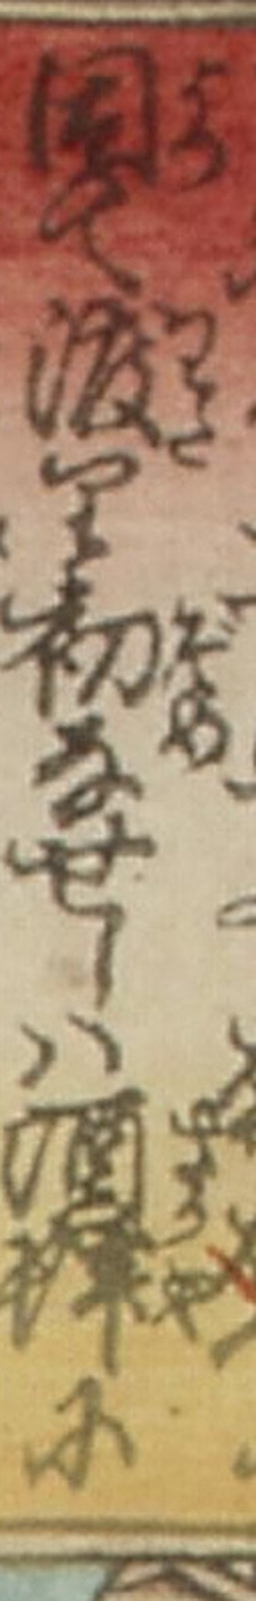因て渡り初なせしは酒肆に
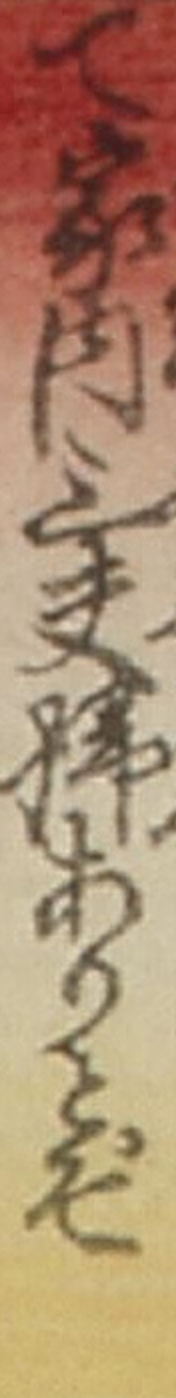て家内三夫婦ありとぞ
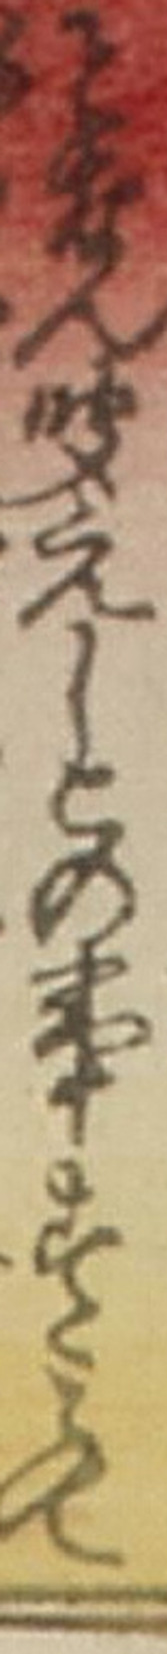となん聞えしこの事すみて
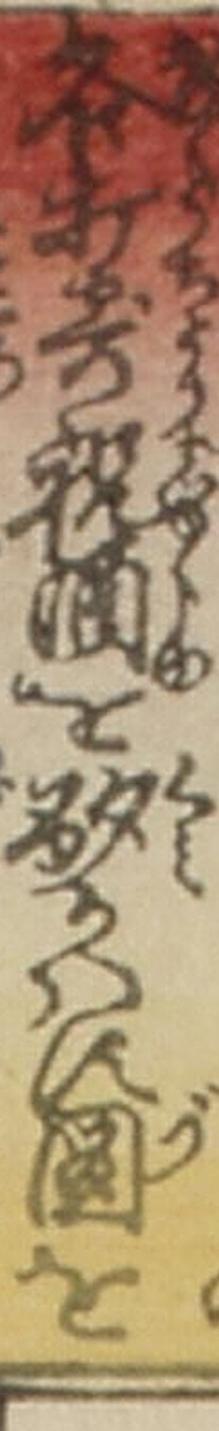各打寄祝酒を酌かはす図を
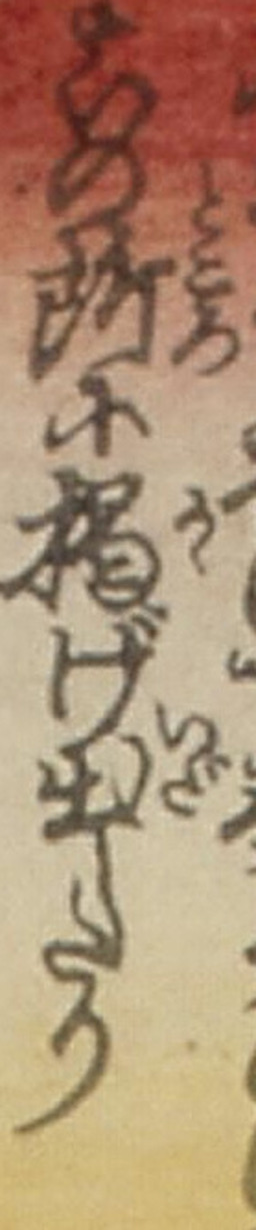この所に掲げ出したり

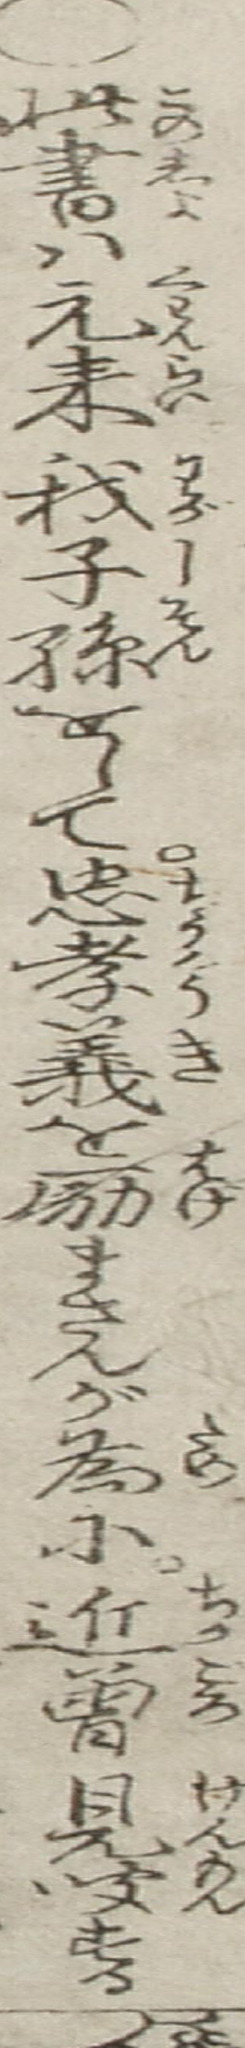○此書は元来我子孫をして。忠孝義を励まさんが為に。近曽見聞する
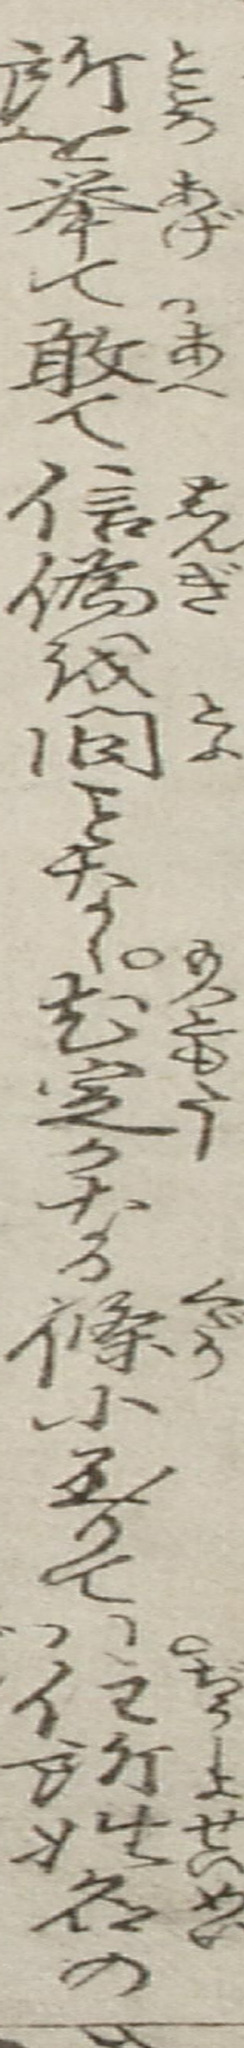所を挙て。敢て信偽を問ことなし。尤定かなる条に至りては。住所姓名の
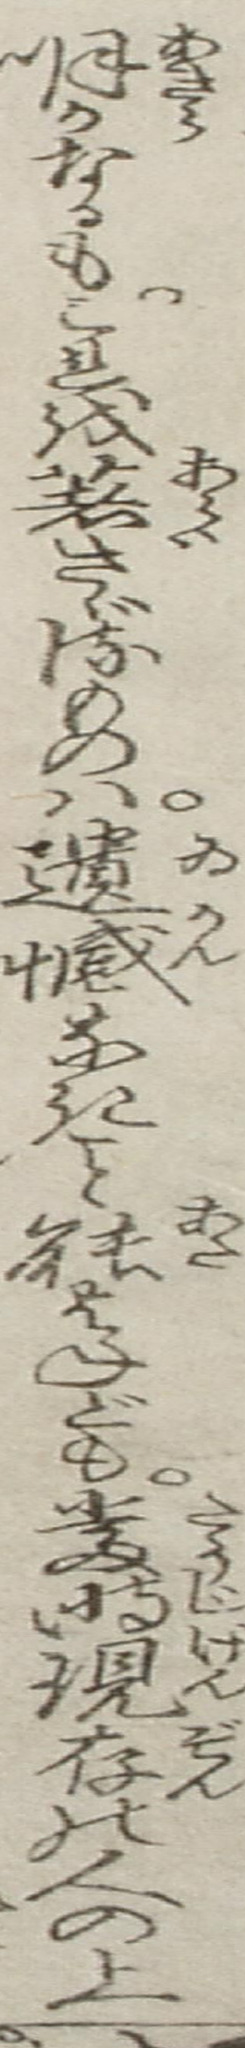明かなるも。これを著さゞるものは。遺憾なきこと能はねども。当時現存の人の上
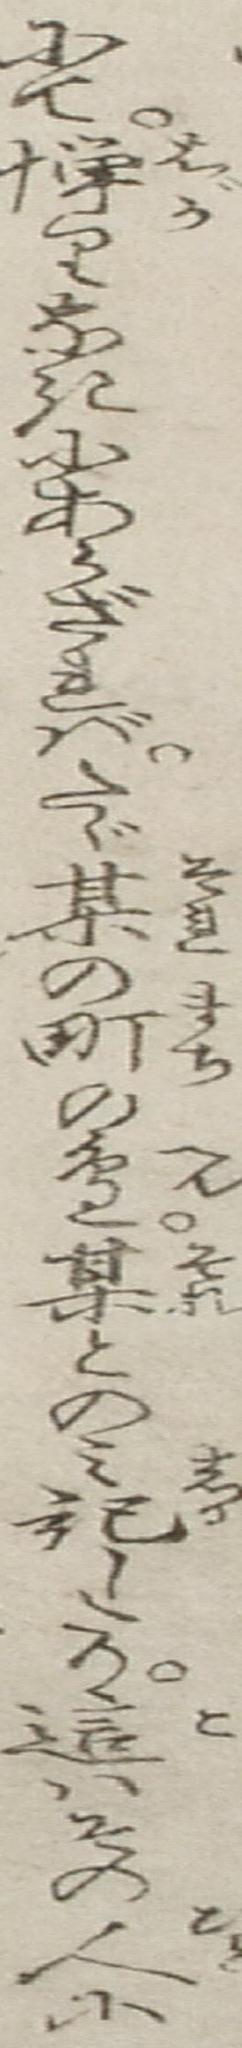にて。憚りなきにあらざれば。たゞ某の町の辺。某とのみ記したり。這はその人に
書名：安政見聞録　上
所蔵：東京大学地震研究所図書室 Earthquake Research Institute Library, The University of Tokyo, JAPAN
